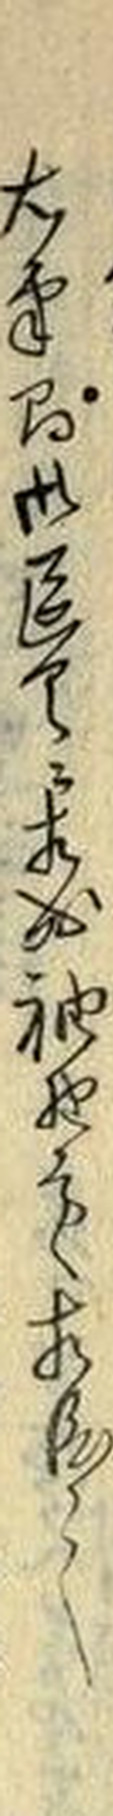右筆間御道具ニ相成袖野方へ相渡之
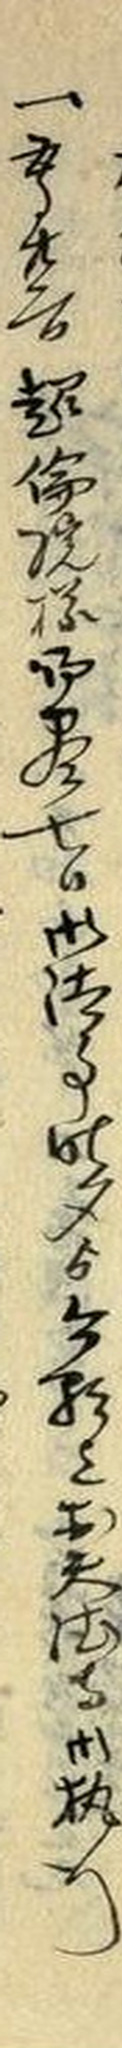一五月廿二日超倫院様御尽七日御法事昨夕ゟ今朝迄於天徳寺御執行
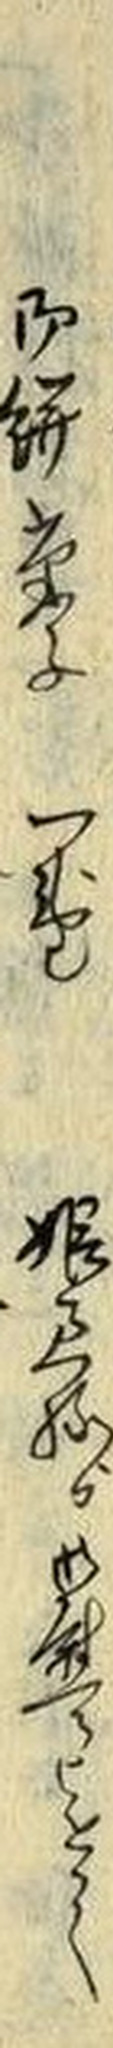御餅菓子一台姫君様ゟ御慰ニ被進之
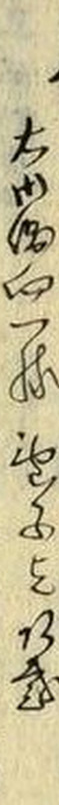右御側向一統台子迄頂戴
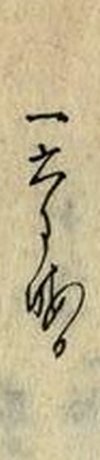一六月晦日
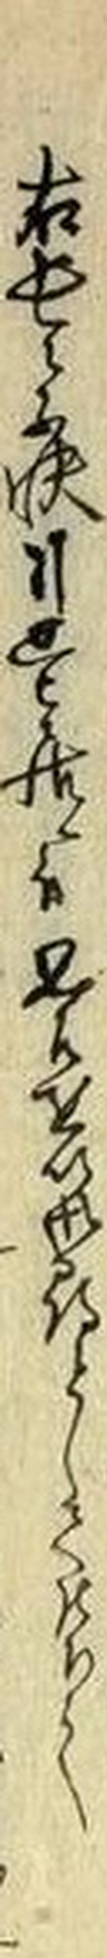右長々不快引込被居候ニ付思召を以御尋として被下之
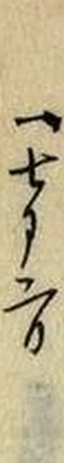一六月晦日
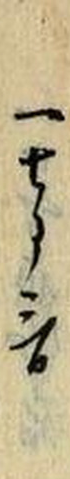一六月晦日
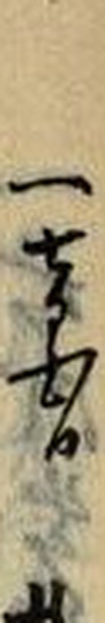一六月晦日
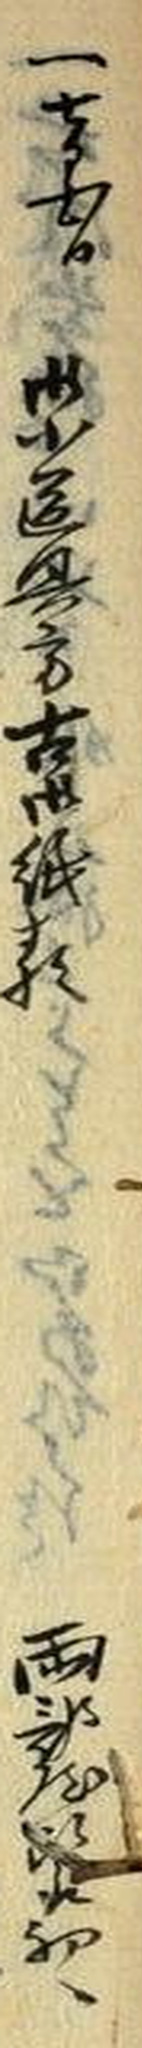一七月五日御小道具方古御紙類両部や頭取初へ
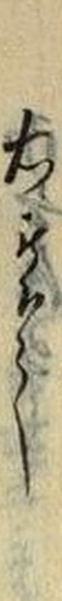右被下之
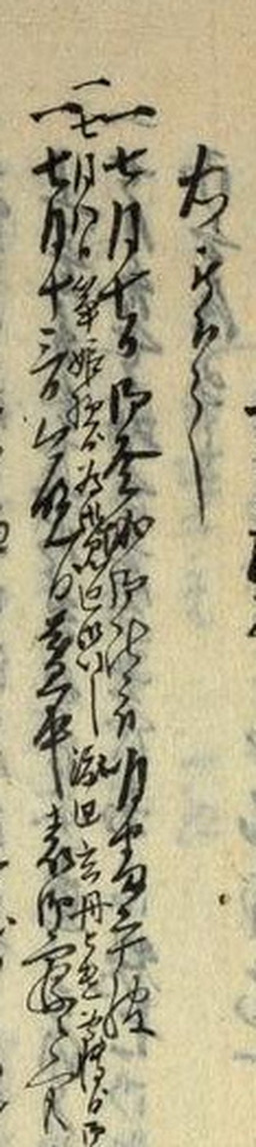一七月七日御登城御断ニ付月番平服
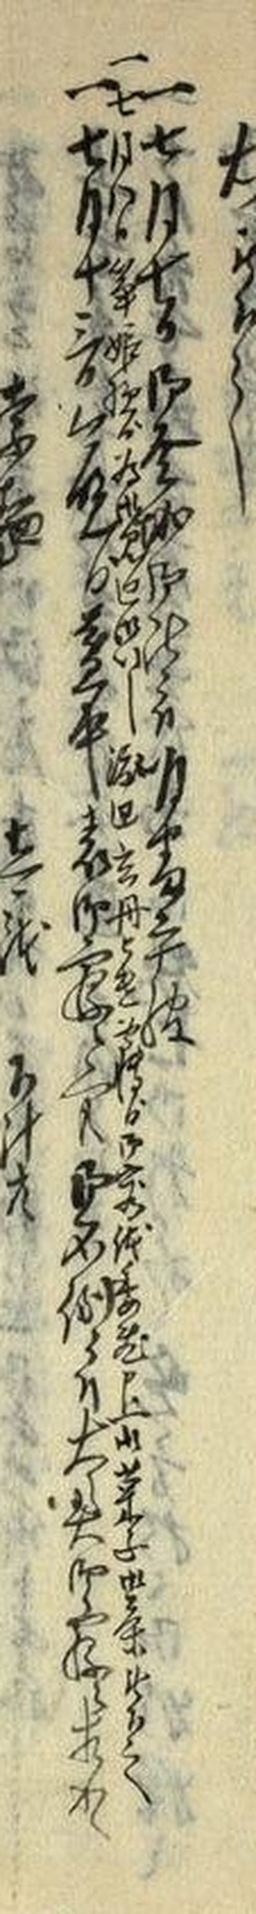一七月八日箏姫様ゟ為御見廻御いし渡辺玄丹被遣専博ゟ御容体委敷申上御菓子御茶被下之
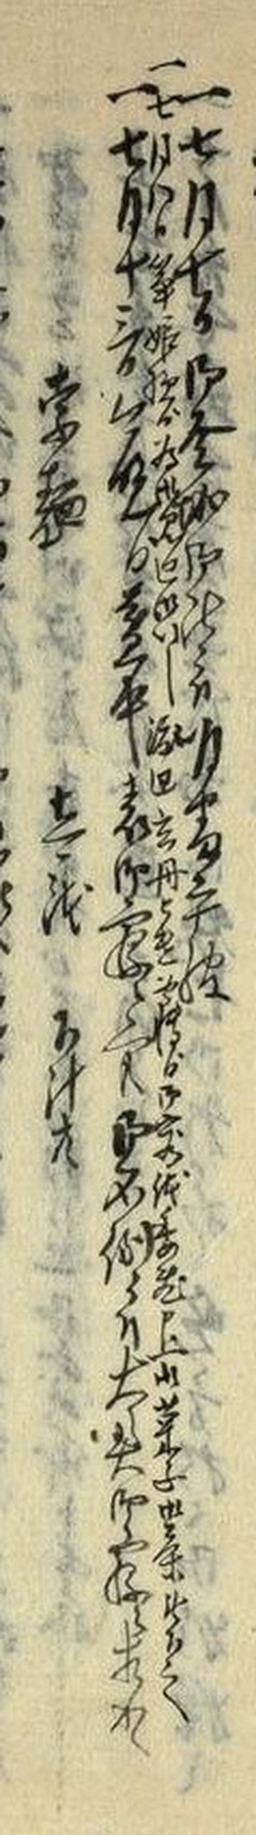一七月十三日今晩ゟ盆中表御寝ニ候へ共御不例ニ付御大奥御寝ニ相成候
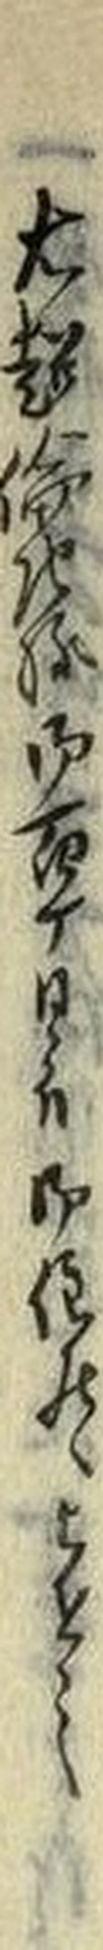一右超倫院様御百ヶ日ニ付御住居へ被進之
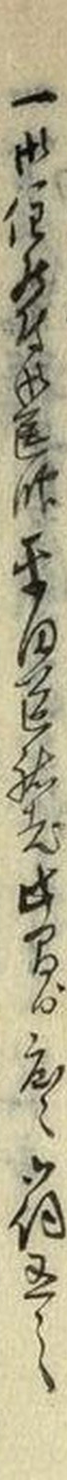一御住居付御医師平田道祐老此間ゟ度々御伺有之
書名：少傅日録抄（斉承付側向頭取日記、在府）
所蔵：福井県文書館 Fukui Prefectural Archives
